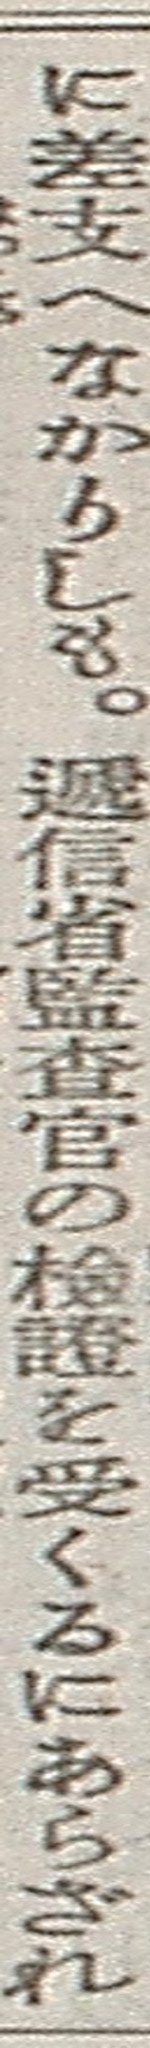に差支へなかりしも。逓信省監査官の検証を受くるにあらざれ
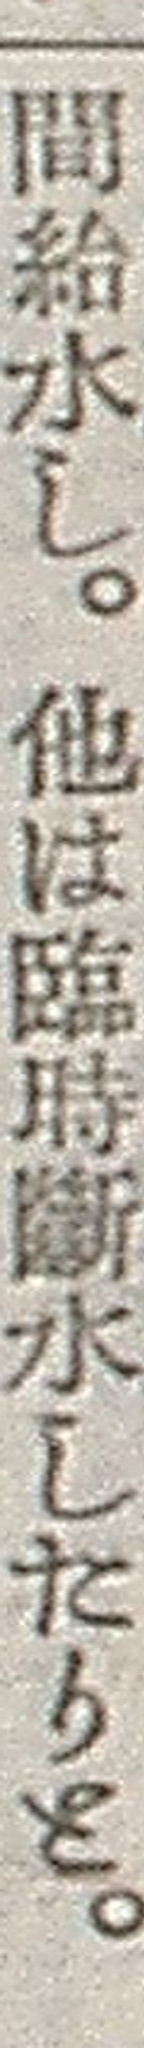間給水し。他は臨時断水したりと。
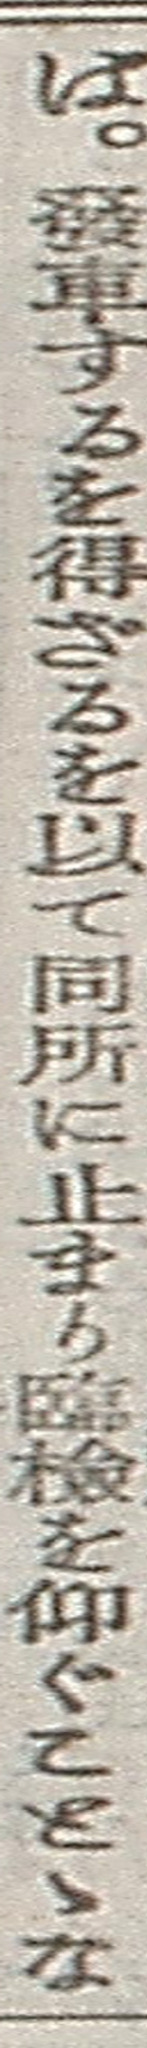ば。発車するを得ざるを以て同所に止まり臨検を仰ぐことゝな
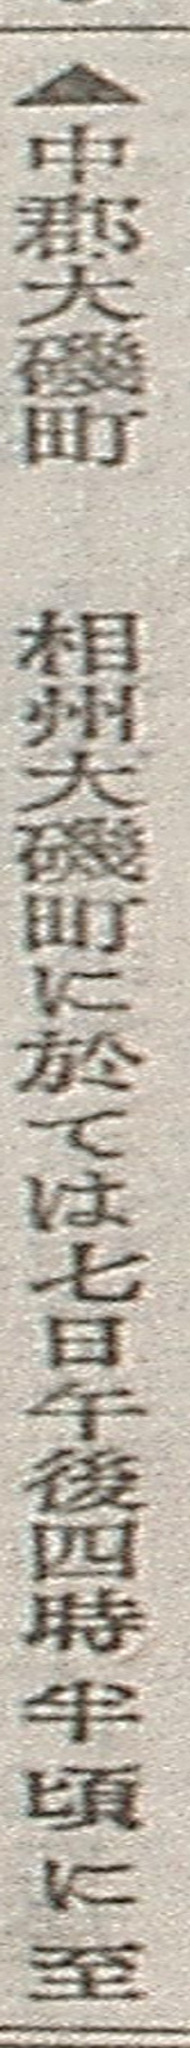▲中郡大磯町相州大磯町に於ては七日午後四時半頃に至

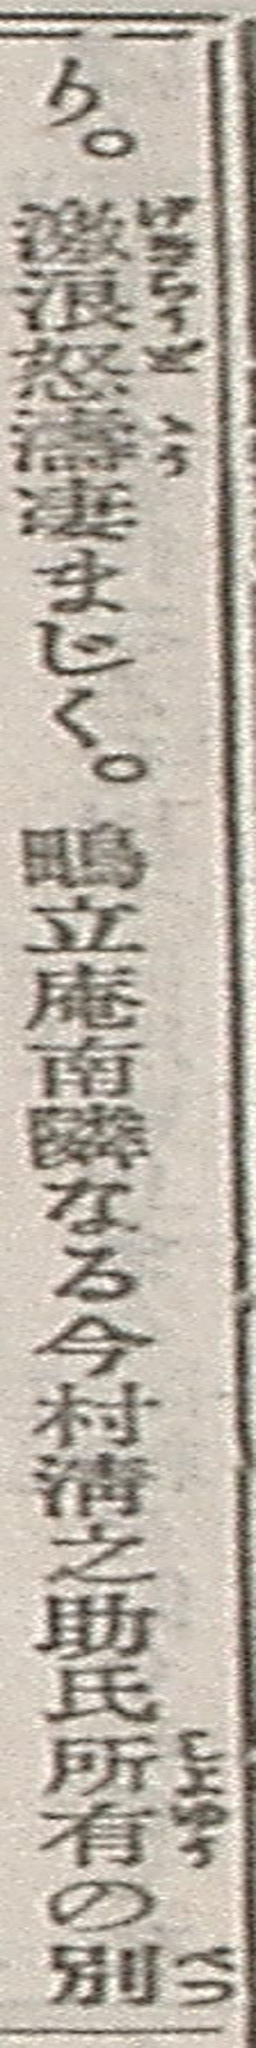り。激浪怒涛凄まじく。鴫立庵南隣なる今村清之助氏所有の別
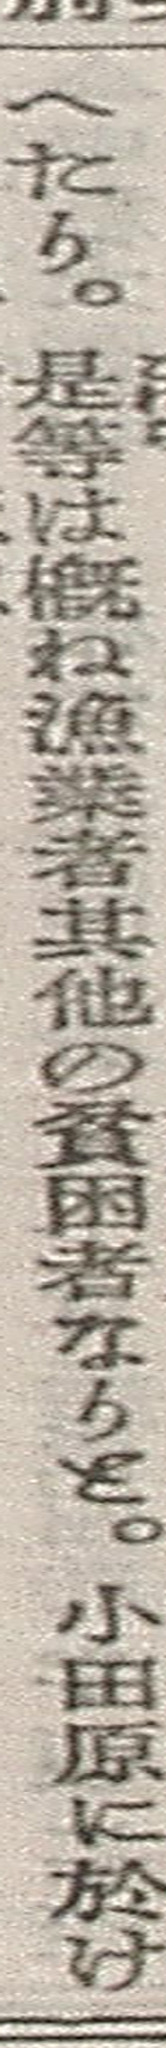へたり。是等は概ね漁業者其他の貧困者なりと。小田原に於け
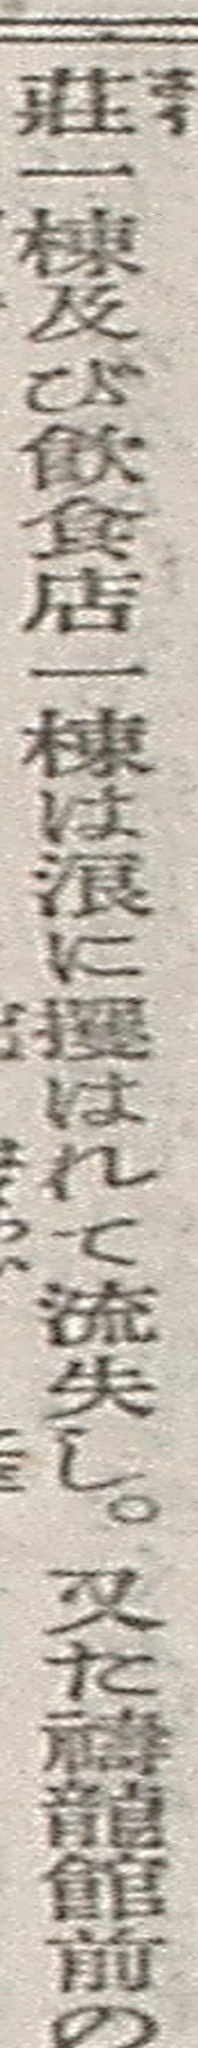荘一棟及び飲食店一棟は浪に攫はれて流失し。又た禕龍館前の
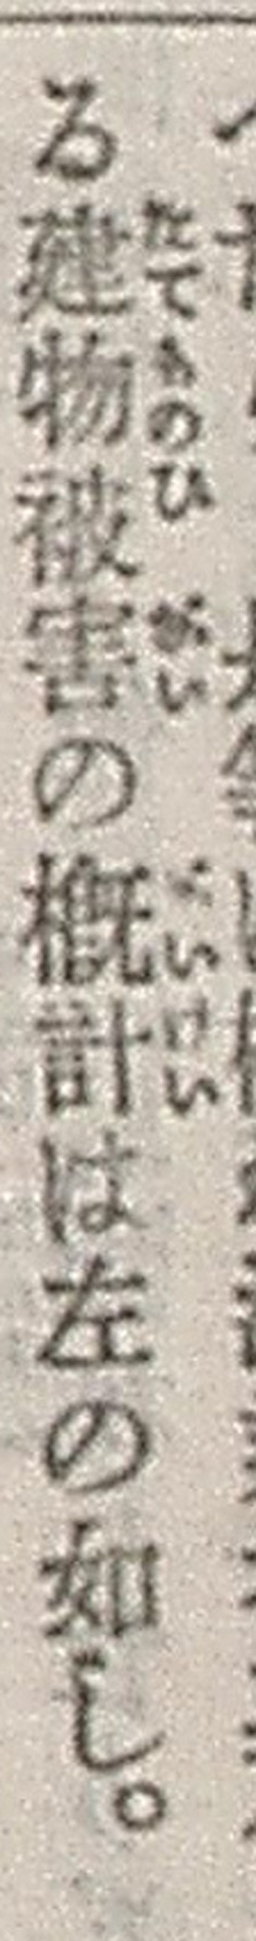る建物被害の概計は左の如し。
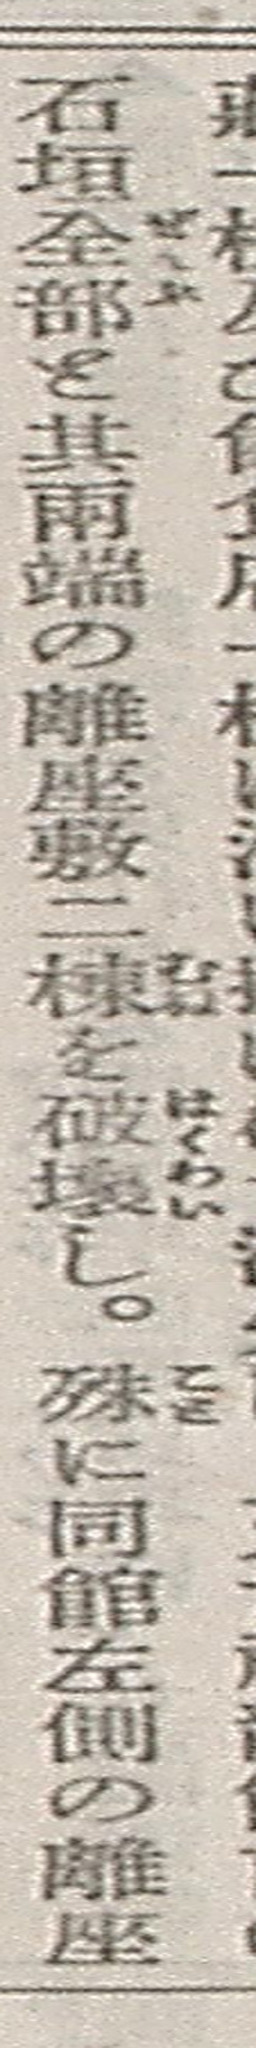石垣全部と其両端の離座敷二棟を破壊し。殊に同館左側の離座
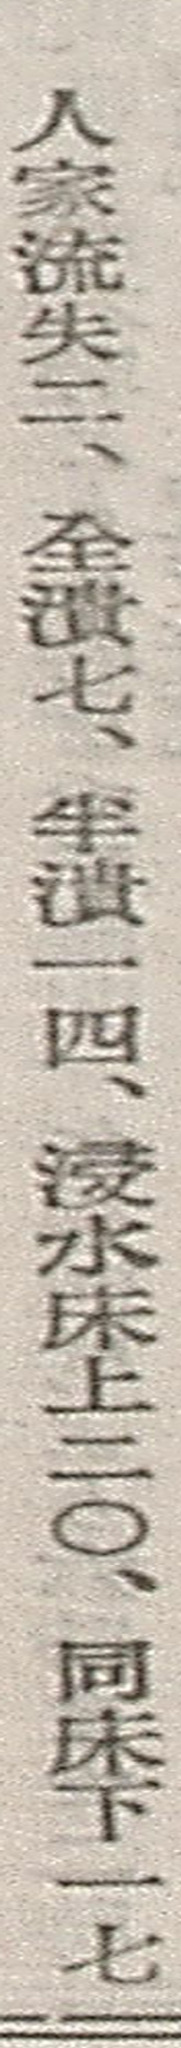人家流失二、全潰七、半潰一四、浸水床上二〇、同床下一七
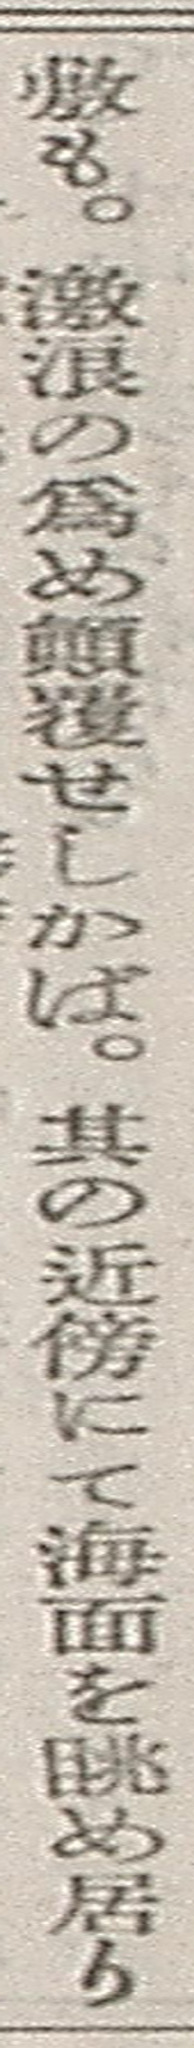敷も。激浪の為め顛覆せしかば。其の近傍にて海面を眺め居り
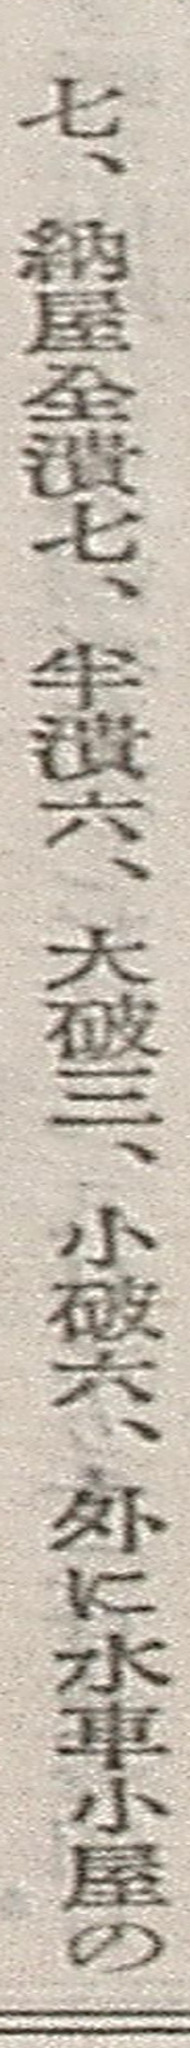七、納屋全潰七、半潰六、大破三、小破六、外に水車小屋の
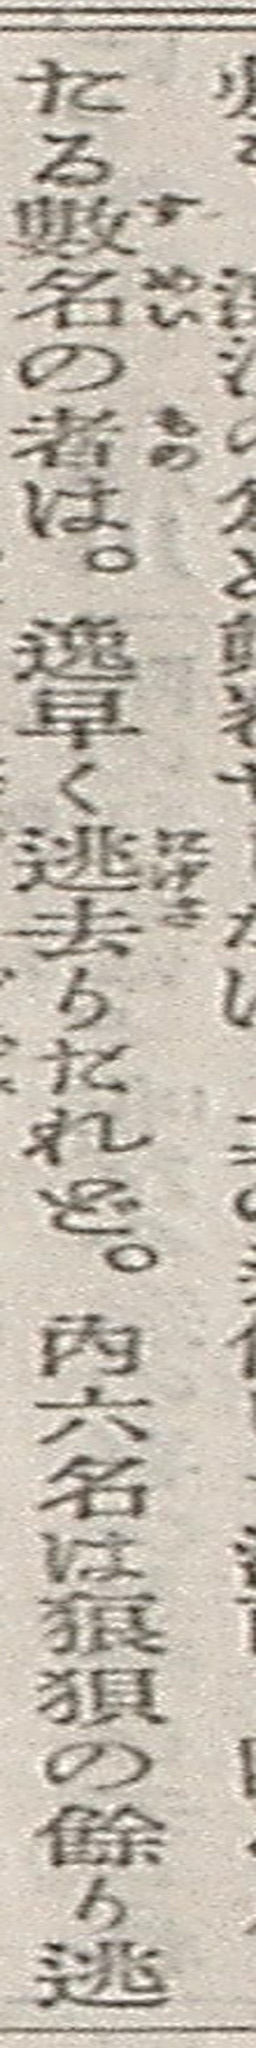たる数名の者は。逸早く逃去りたれど。内六名は狼狽の余り逃
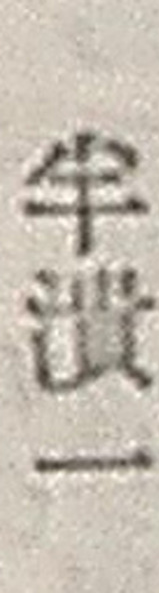半潰一
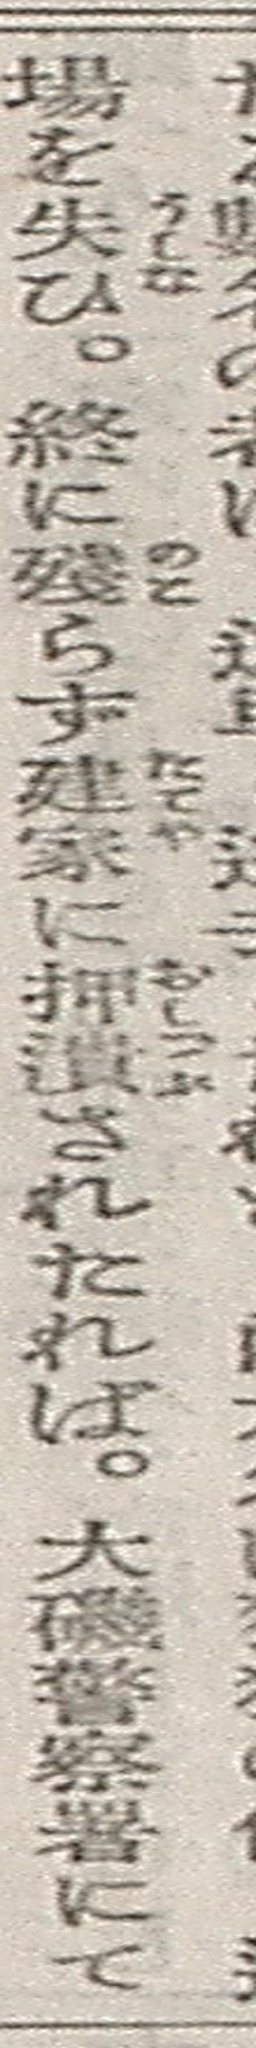場を失ひ。終に残らず建家に押潰されたれば。大磯警察署にて
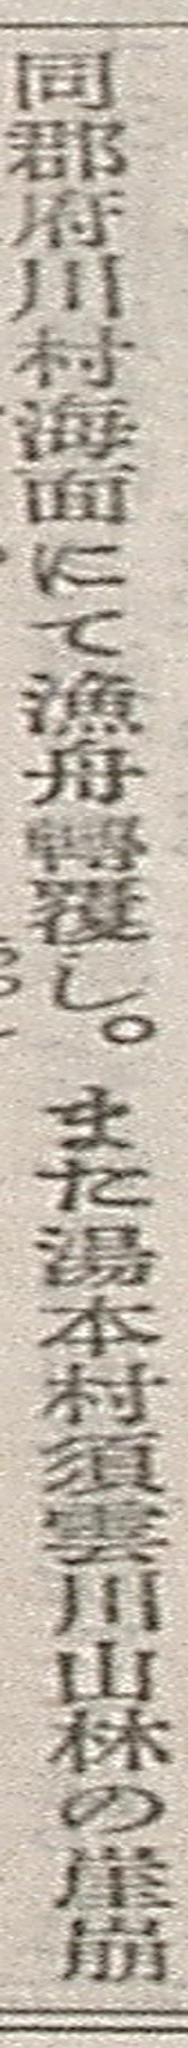同郡府川村海面にて漁舟転覆し。また湯本村須雲川山林の崖崩
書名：風俗畫報臨時増刊第百九十九號　明治三十二年十月各地災害圖會（前編之續）
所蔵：東京大学地震研究所図書室 Earthquake Research Institute Library, The University of Tokyo, JAPAN
